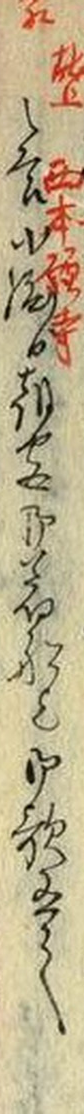之節小渡ゟ朝宮御着船迄御歌有之
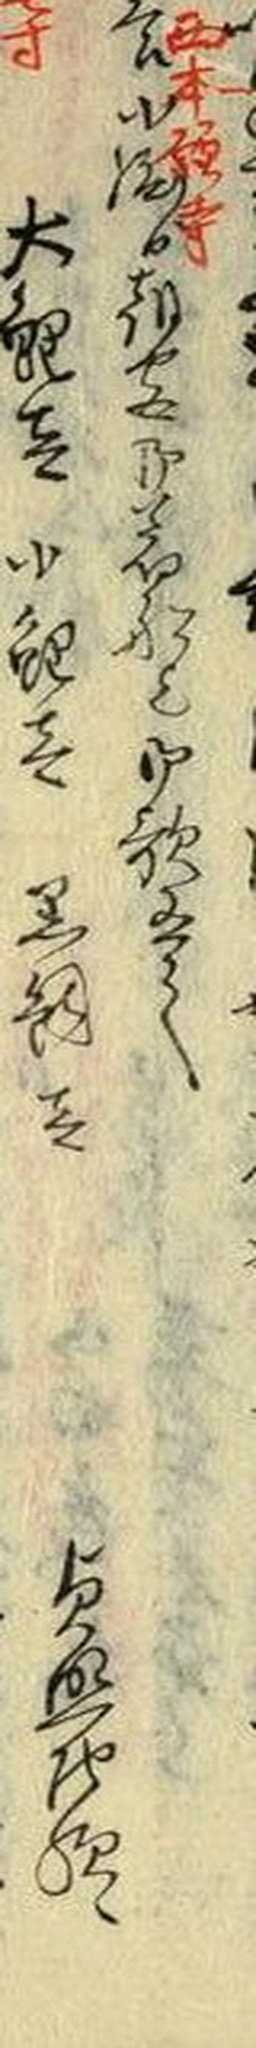大鯉壱小鯉壱黒鯛壱貞照院様へ
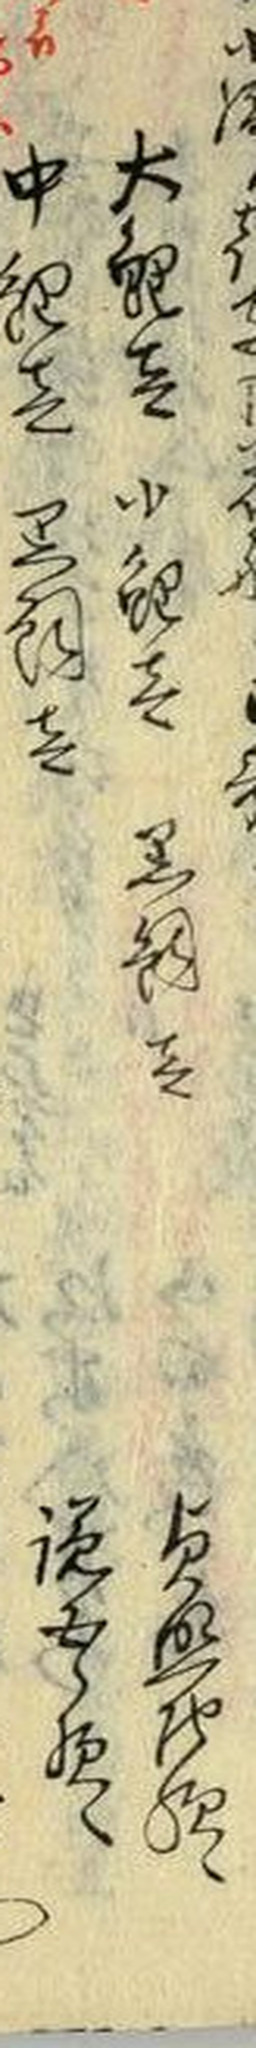中鯉壱黒鯛壱謙五郎様へ
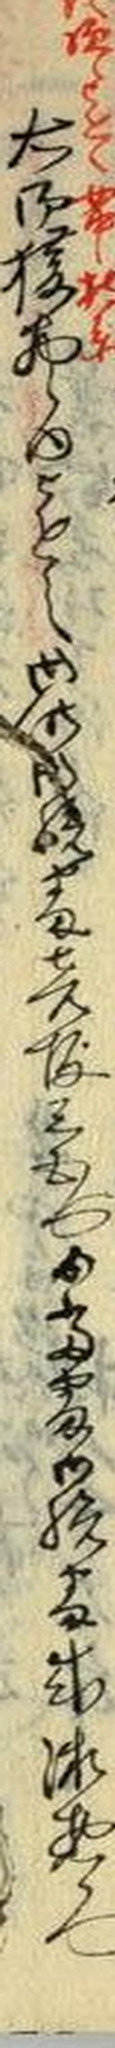右御獲物之内被進之御供御膳番彦坂三五右衛門ゟ当番御膳番成瀬惣右衛門
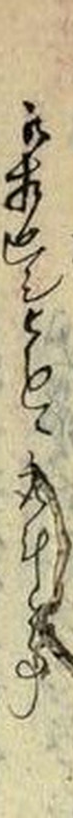江相廻シ被進ニ取計候事
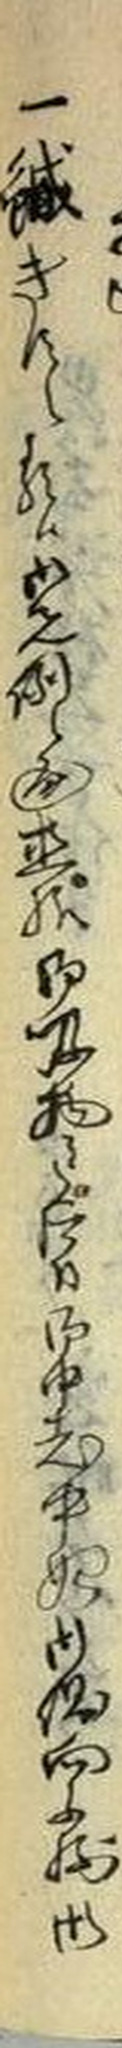一鯎きす之類ハ御先例之通直様御吸物ニ被仰付御中老中始御側向不残御
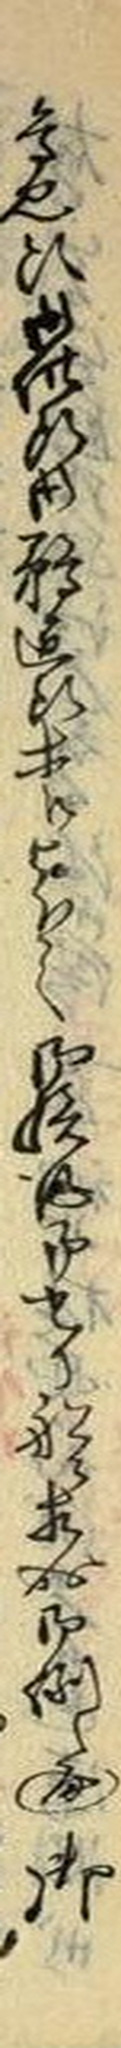鳥見頭御供頭御鵜匠頭等江被下之御膳後御登り船ニ相成御例之通御
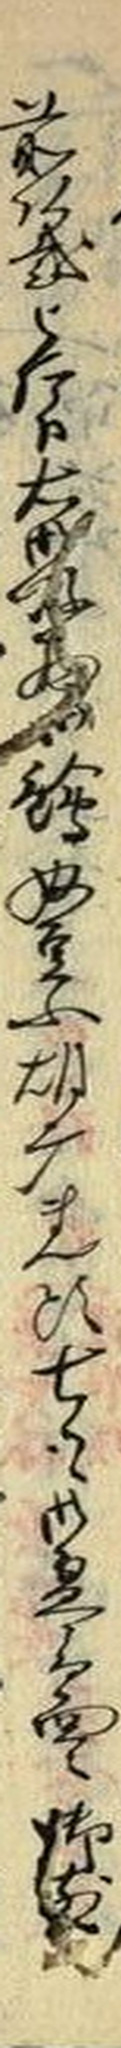前頂戴被仰付右御吸物御膾奴豆ふ胡麻まん頭七ツヽ御盆ニ而面々御前へ
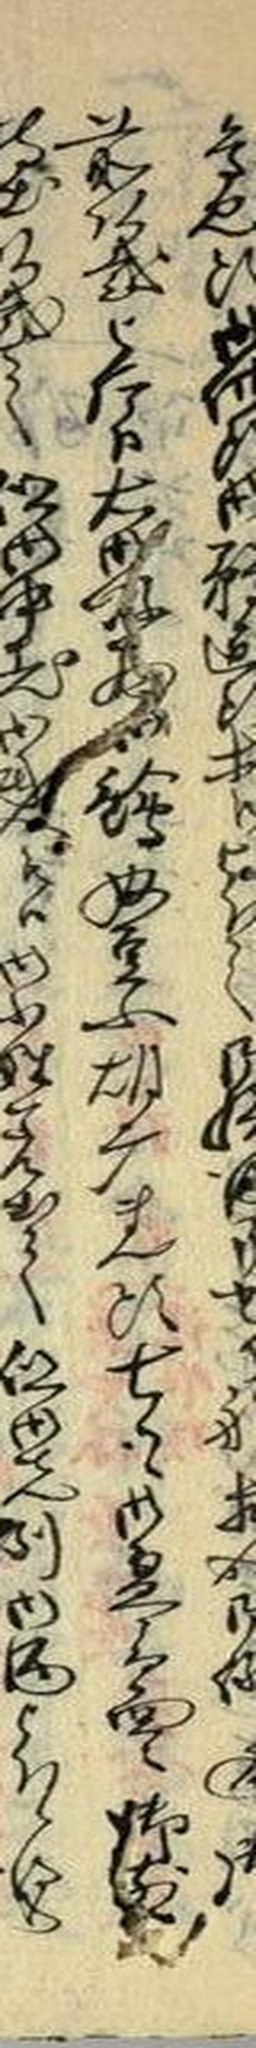持出頂戴之但御中老御用人江ハ御小姓差出之但御先例御酒被下候得共
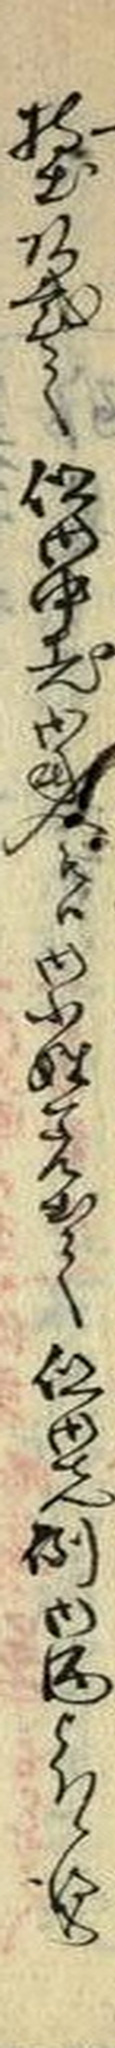持出頂戴之但御中老御用人江ハ御小姓差出之但御先例御酒被下候得共
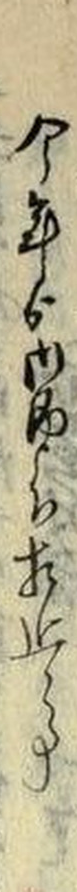今年ゟ御酒被下相止候事
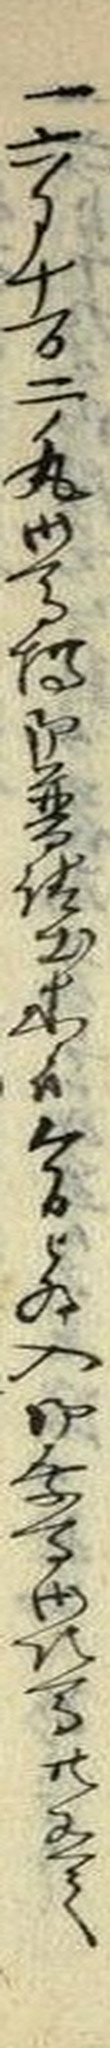一六月十一日二ノ丸御馬場御普請出来ニ付今日被為入御乗馬御次馬共有之
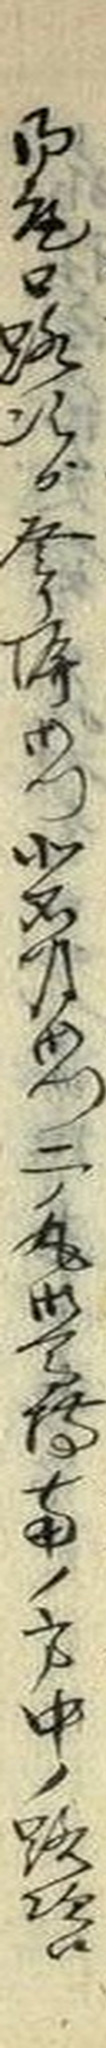御庭口路次ゟ登り塀御門北不明御門二ノ丸御馬場南ノ方中ノ路次口
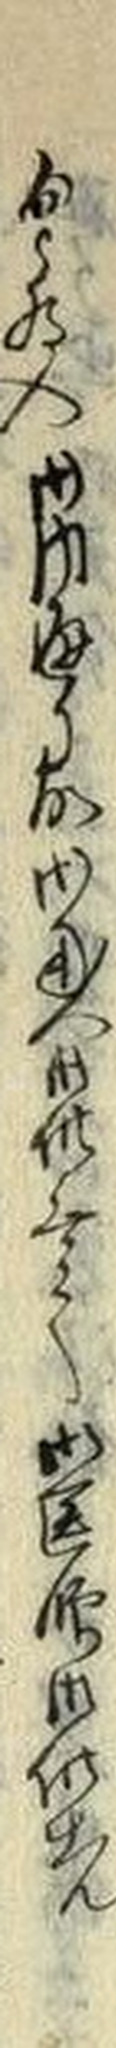ゟ被為入御内通り故御用人御供無之御医師御供出ル
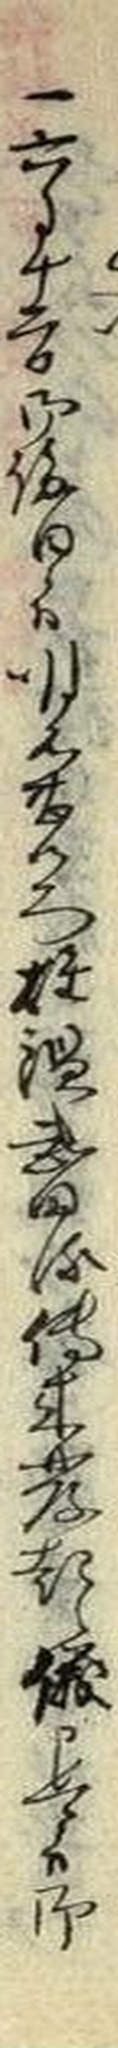一六月十二日御講日ニ付明石甚左衛門権鑑武田流伝来発起之儀申上候ニ付御
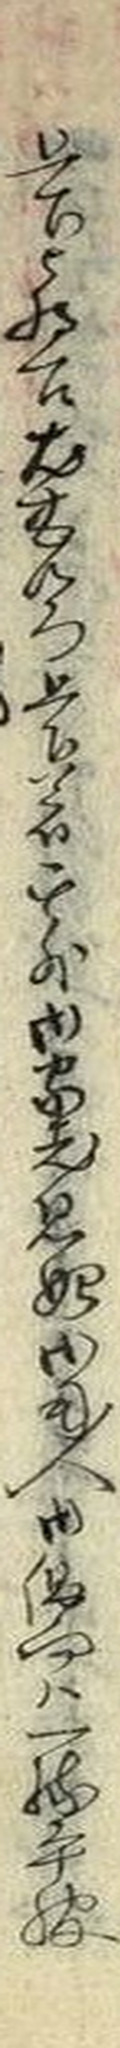上下被為召尤甚左衛門上下着其外御家老息始御用人御側向ハ一統平服
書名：少傅日録抄（斉承付側向頭取日記、在国）
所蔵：福井県文書館 Fukui Prefectural Archives
